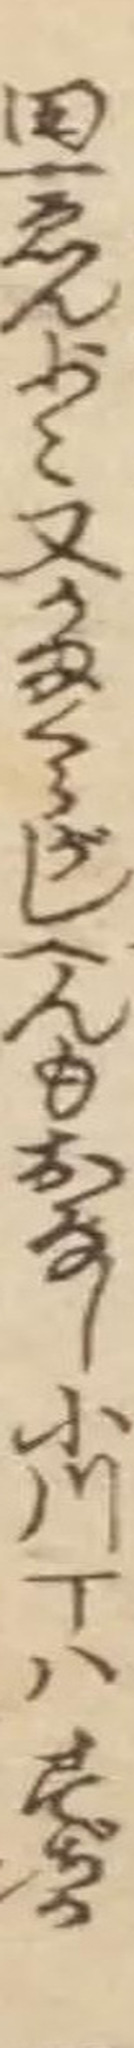田一ゑん少〃又かまくらがしへんもおなし小川丁はすぢか
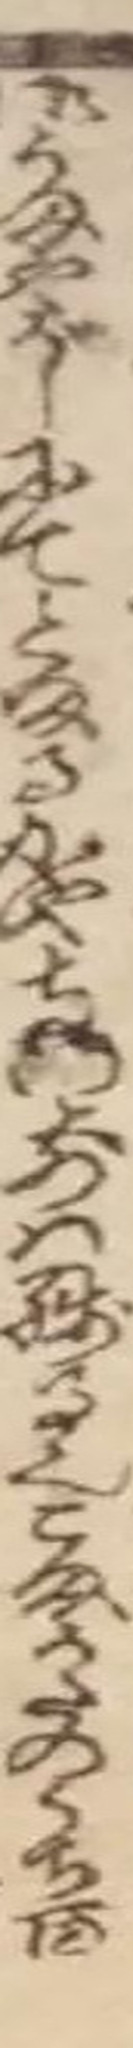御うまやばしにてとまるかや寺門前は残る也こまかたのうち百
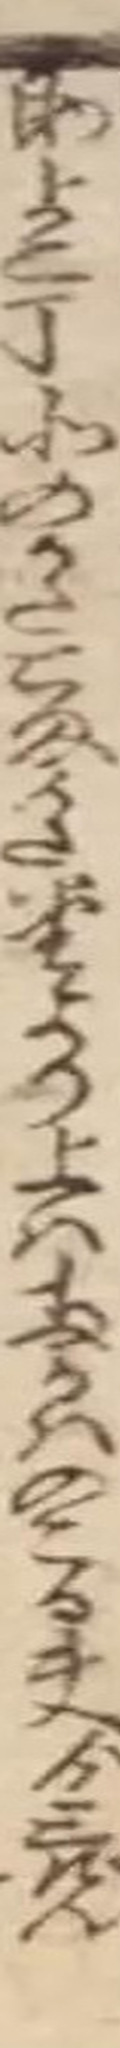助よこ丁北のかたこまかた堂より上は両かはのこる夫より三げん
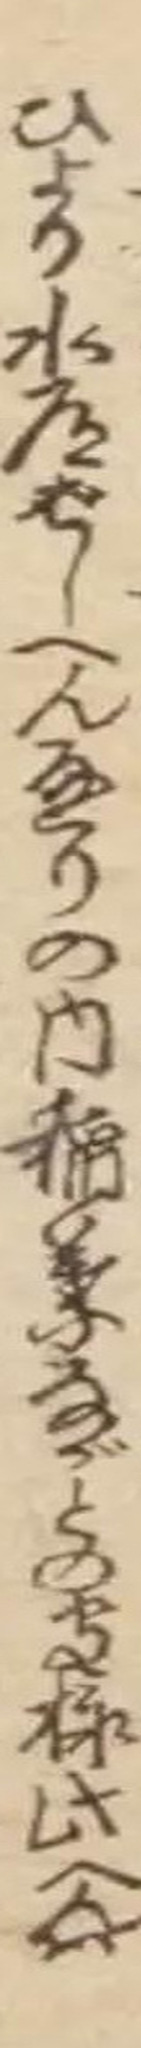ひより水道ばしへん通りの内稲葉ながとの守様此へんは
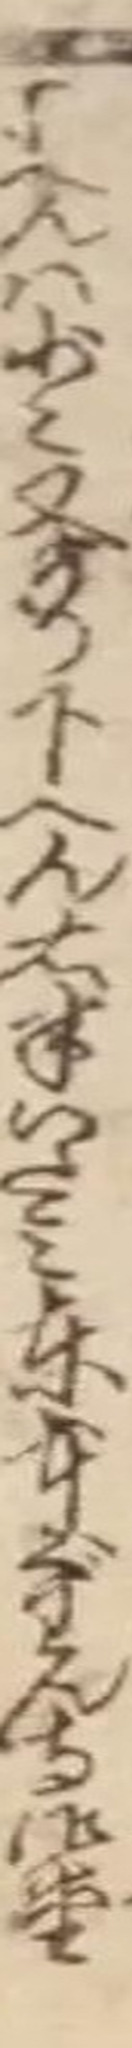丁へんは少々又もり下へん大半いたみ東本ぐわん寺御堂
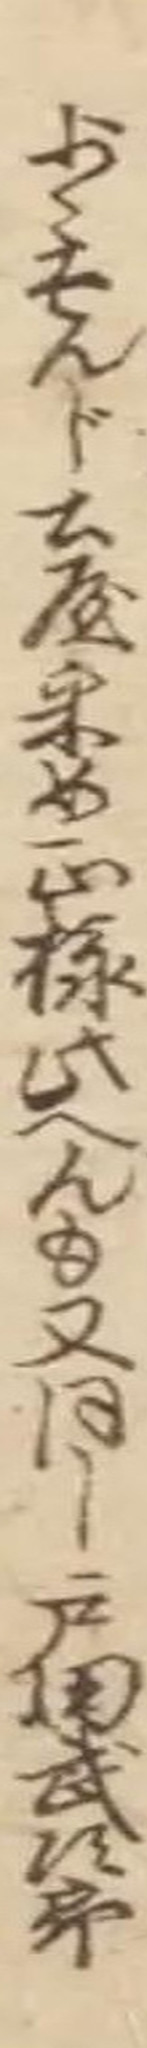少〃そんじ土屋采め正様此へんも又同し戸田武治郎
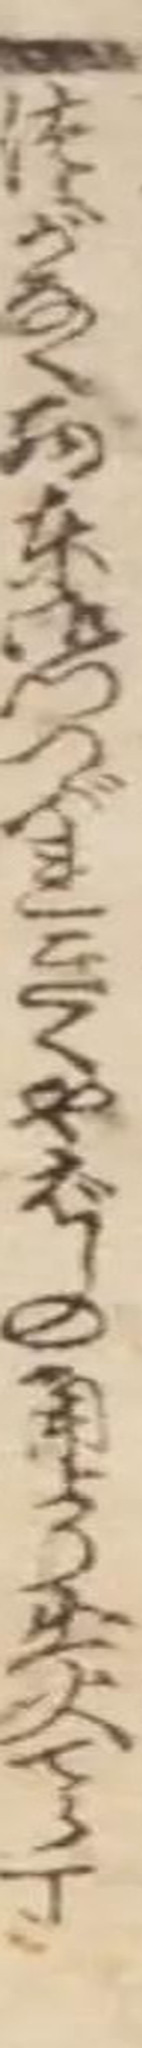つゝがなく南東御門つぶれきくやばしの角より出火てら丁
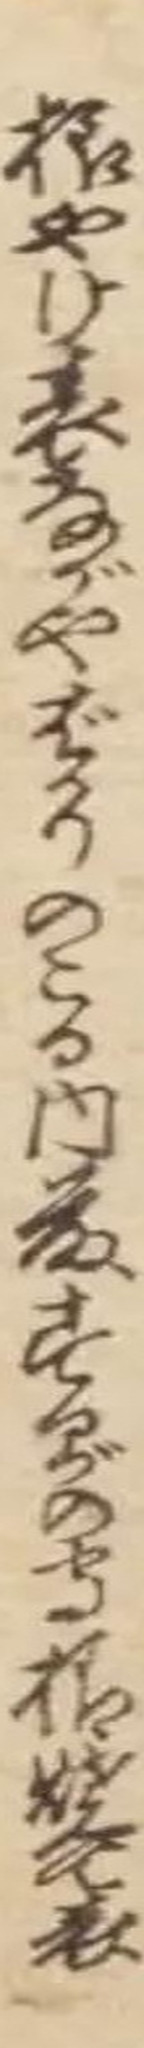様やけ表ながやばかりのこる内藤するがの守様焼けて表
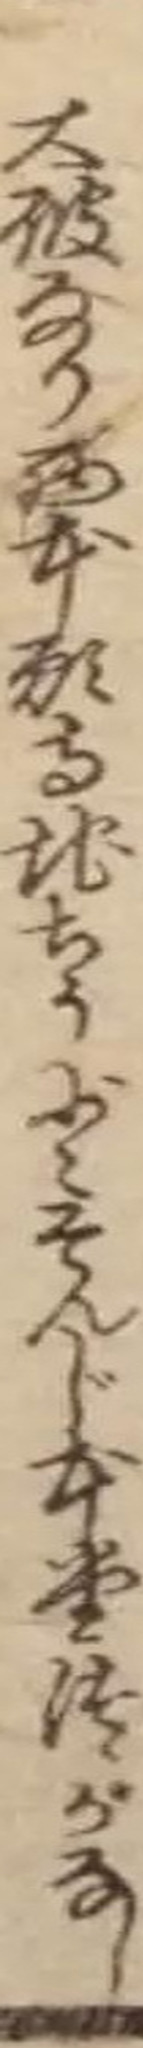大破なり西本願寺地ちう少々そんじ本堂つつがなし
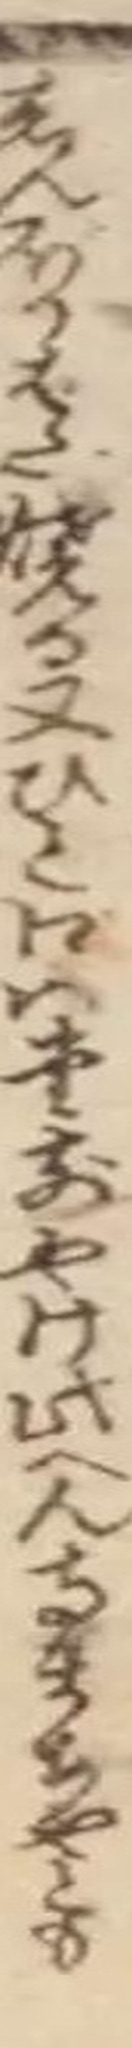しんぼりばた焼る又ひと口は堂前やけ此へん寺まちやとも
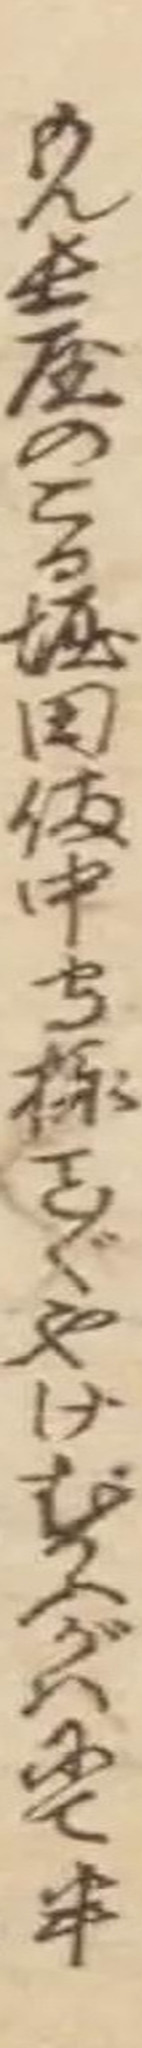もん長屋のこる堀田備中守様こと〴くやけむかふがはにて半
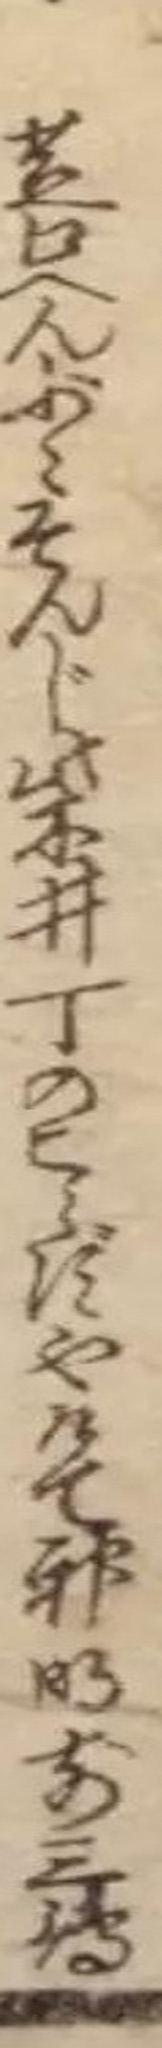芝口へん少々そんじ柴井丁のこらずやけて神田前三橋
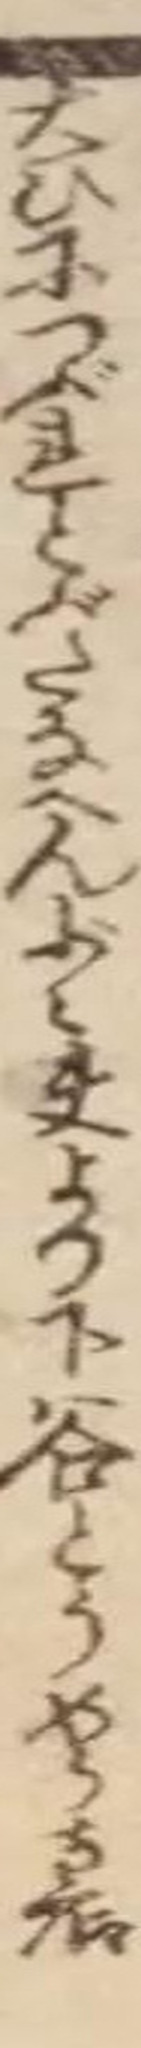大ひにつぶれとぶたなへん少々夫より下谷とうめう寺店
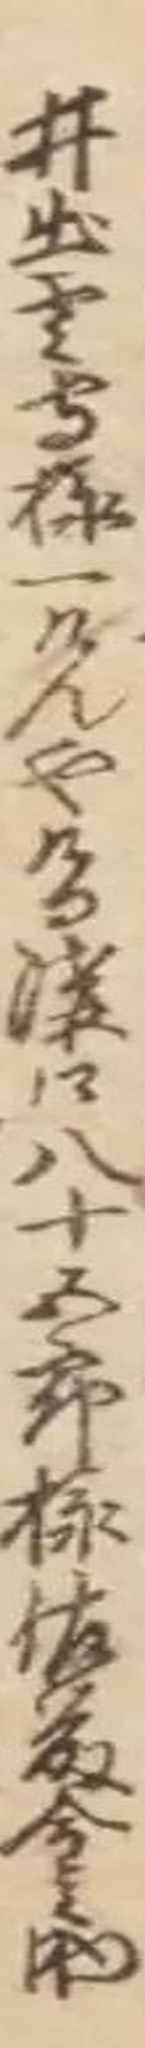井出雲守様一けんやける溝口八十五郎様佐倉今之助
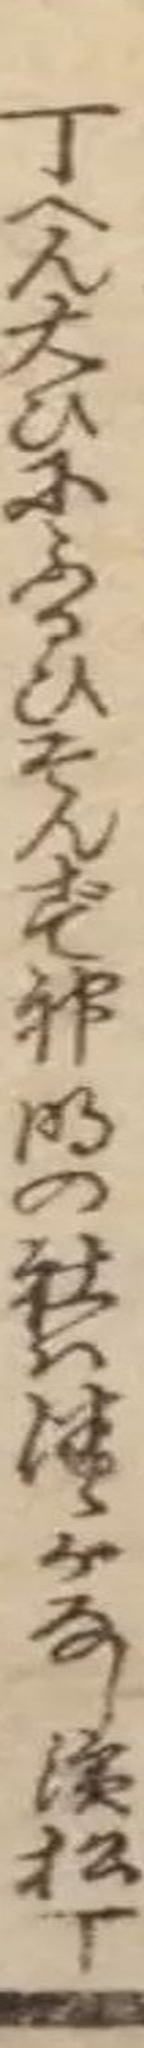丁へん大ひにふるひそんず神田の社はつつケなし浜松町
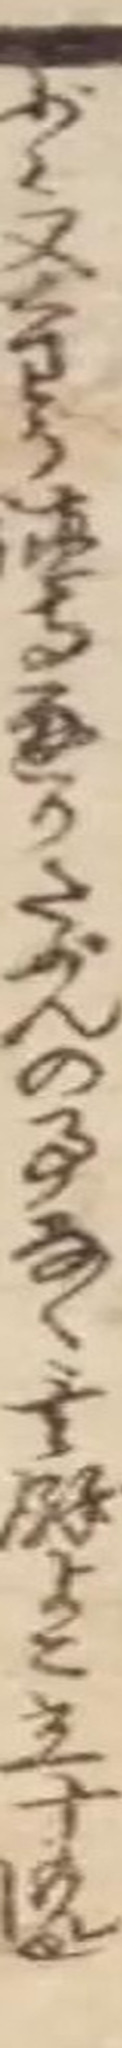少々又くわう徳寺通りたぶんの事なく其余よこ立十もんじ
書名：関東大地震末代鑑
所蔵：国立国会図書館 National Diet Library, JAPAN
